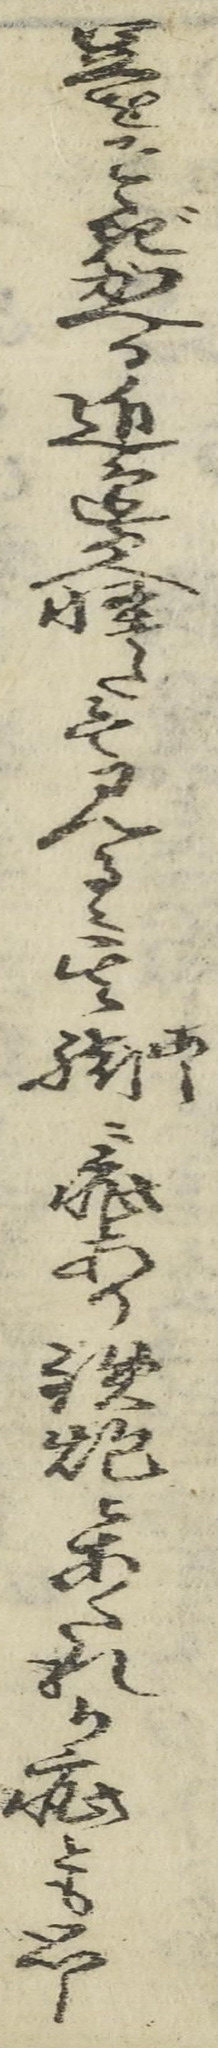足をそゝぎかへる近辺の人怪とて見るに其脚に疵あり鉄砲にあたれり疵とも思し
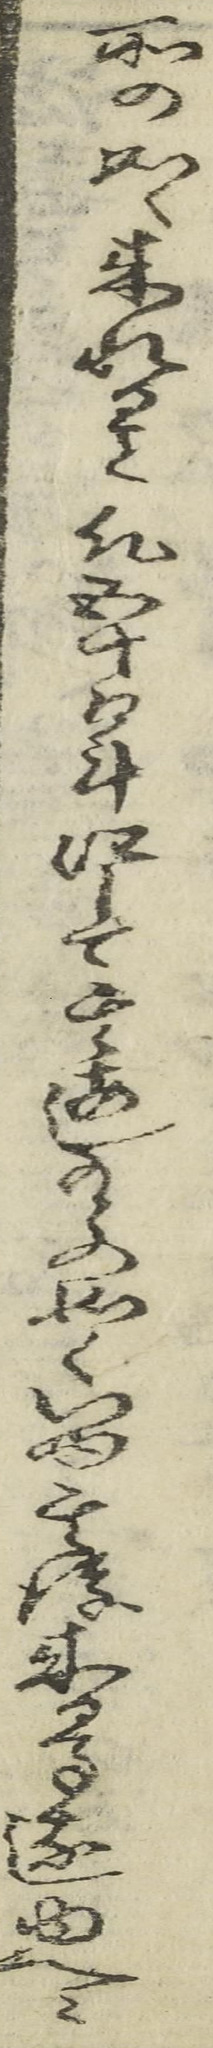所の如く来れりと凡五十日計にして其あしもとの如くいゆ其後来る事なしゆへに
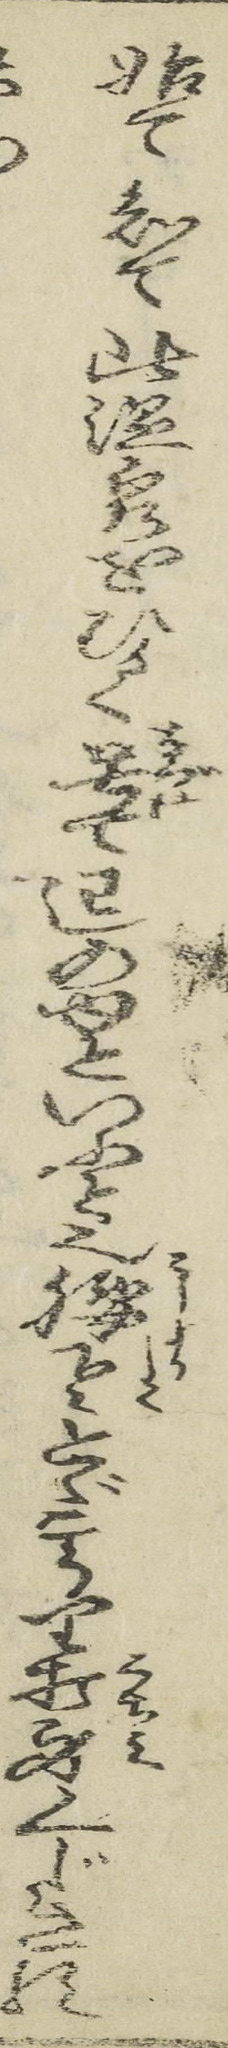始て知て此温泉をひらく号てわしのゆといふと也腰下にとゞこうり打身くじきの
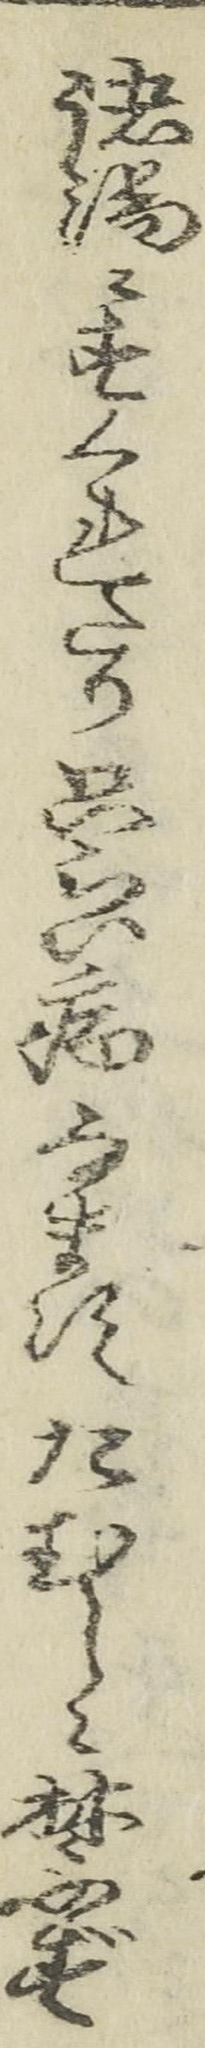諸湯にすくれたり只らい病なますたむしに禁ず
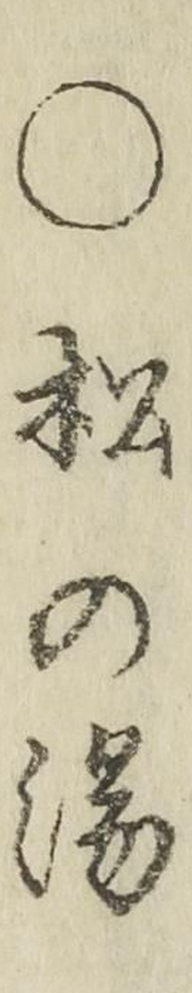〇松の湯
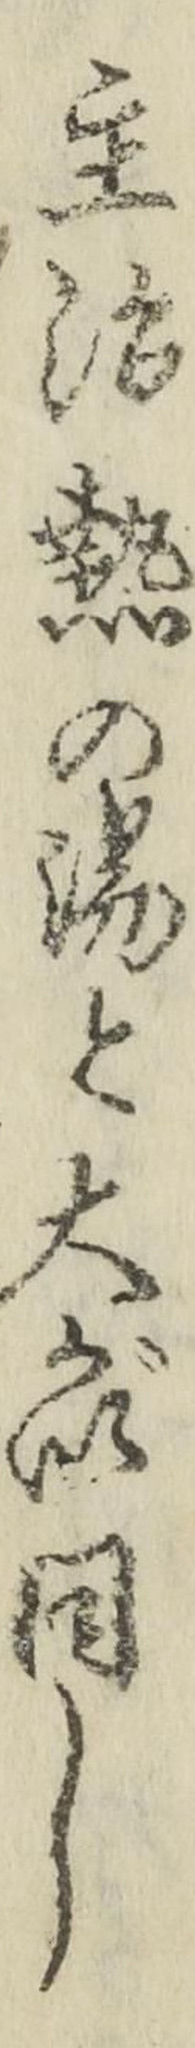主治熱の湯と大がい同し
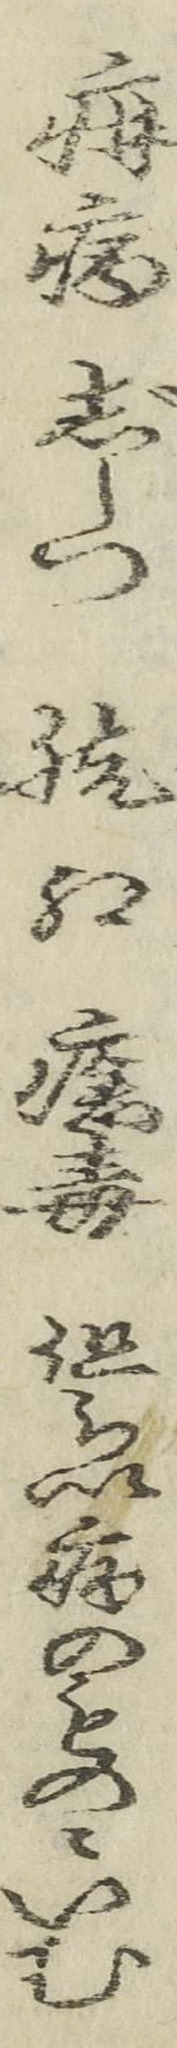罹病じしつ脱肛瘡毒但らい病のものにいむ
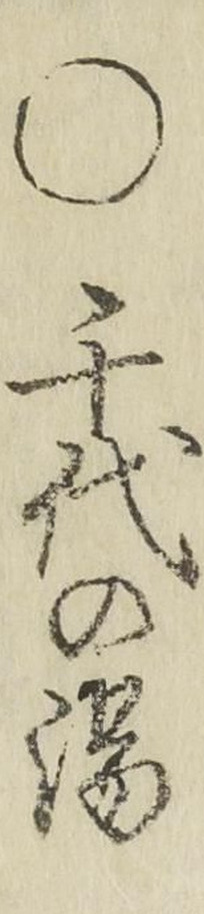〇千代の湯
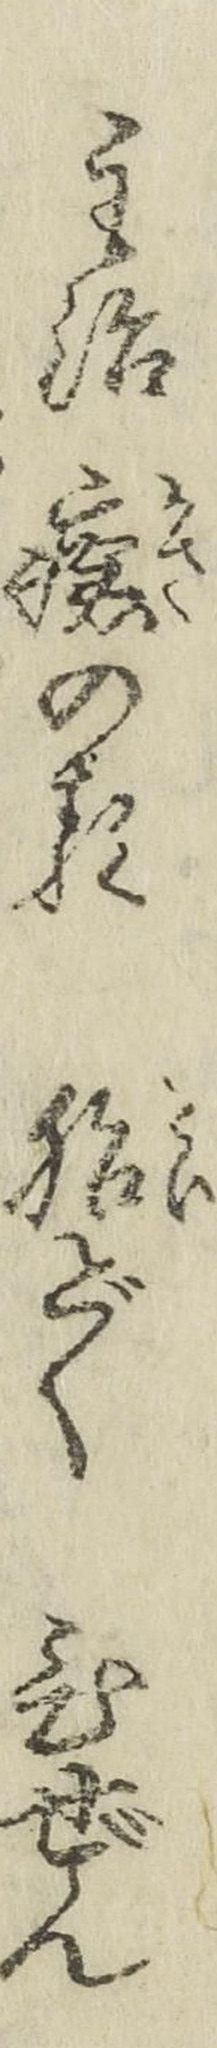主治瘡の類胎どくひぜん
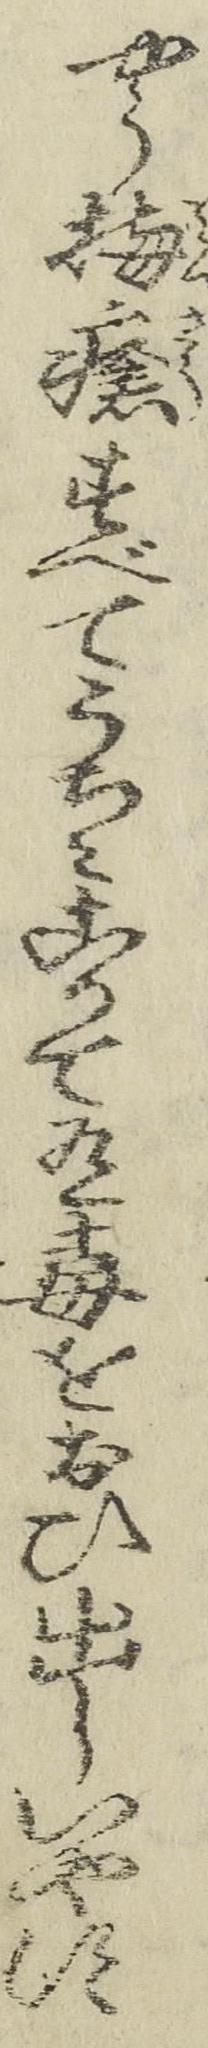やう梅瘡すべてうちにありて有毒をおひ出しいやす
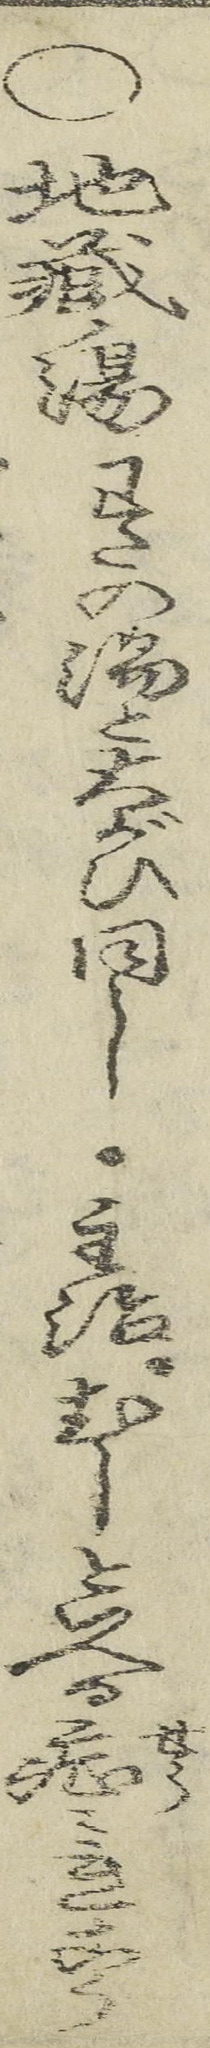わたの湯と大がひ同し・主治・ひしといへる症に連あり
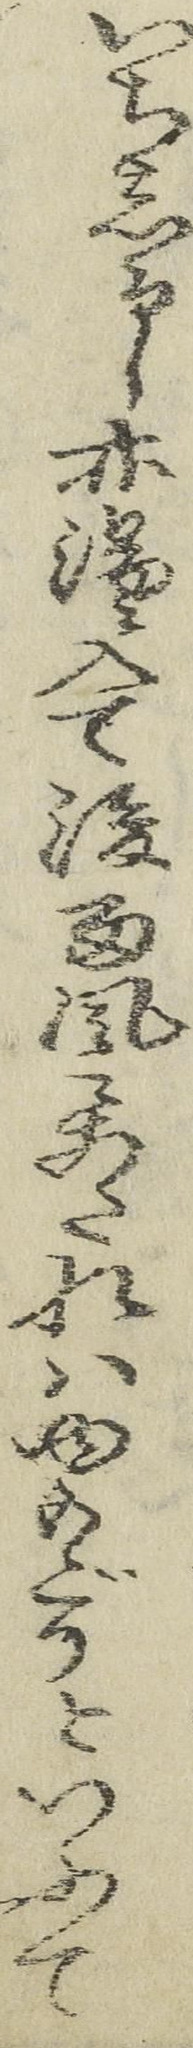いちしるし亦湯に入てあと西風にあたれはゆもどりといふて
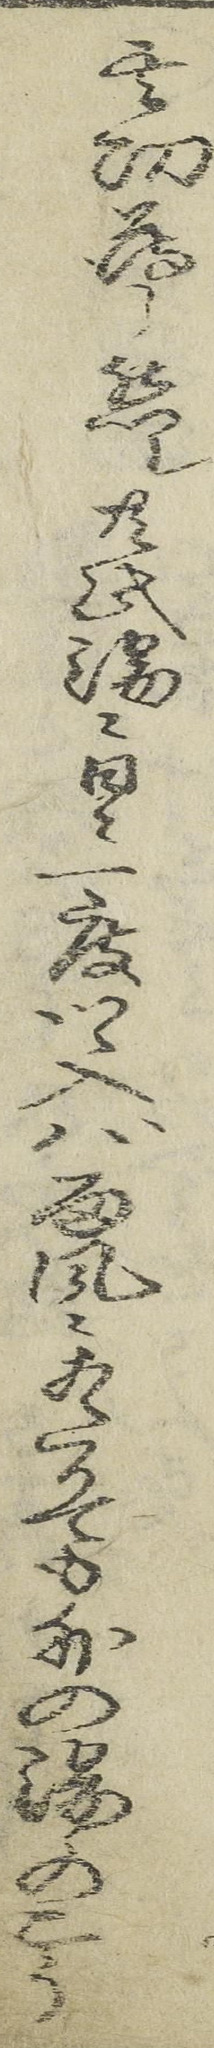其効薄し然れ共此湯に日ゝ一度つゝ入ば西風にあたりても外の湯のこう
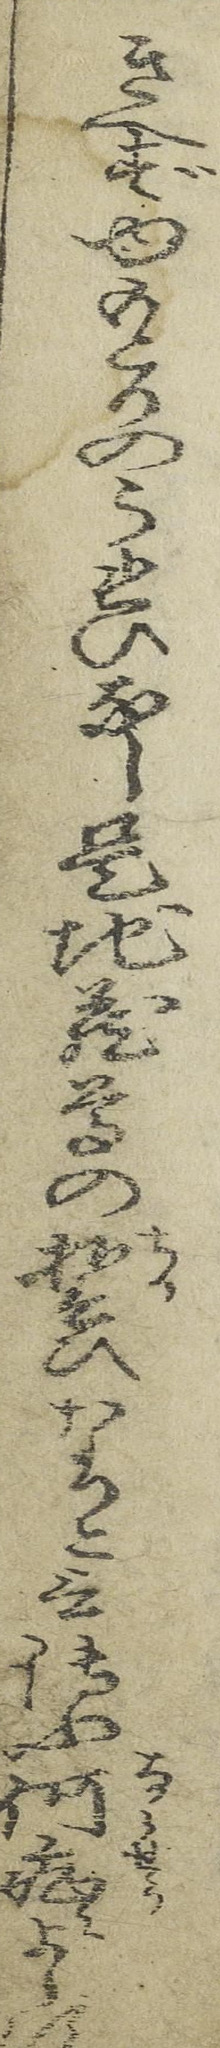きへずゆあたりのうれいなし是地蔵等の誓ひなりと云伝ふ何症よらず

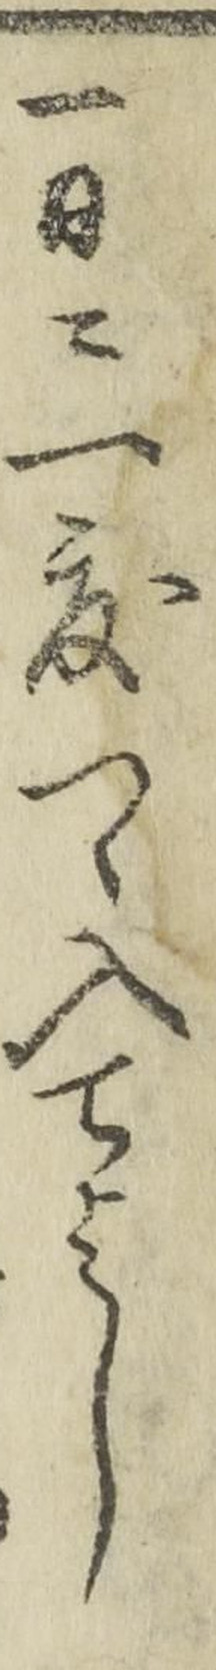一日に一度つゝ入てよし
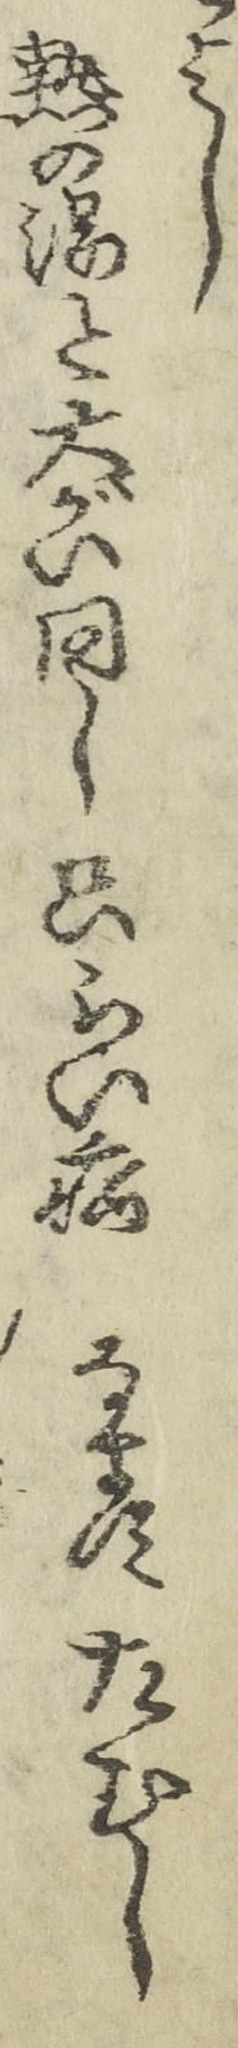熱の湯と大がい同し只らい病なますたむし
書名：草津温泉　入湯案内記
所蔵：東京大学地震研究所図書室 Earthquake Research Institute Library, The University of Tokyo, JAPAN
